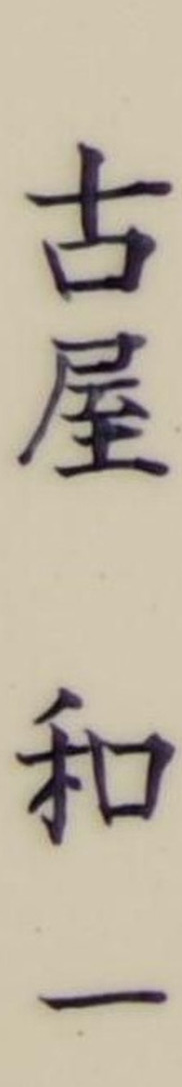古屋和一

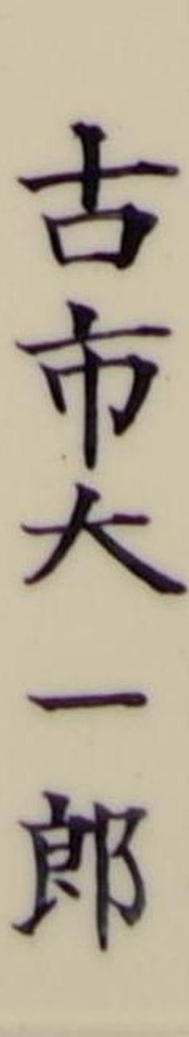古市大一郎
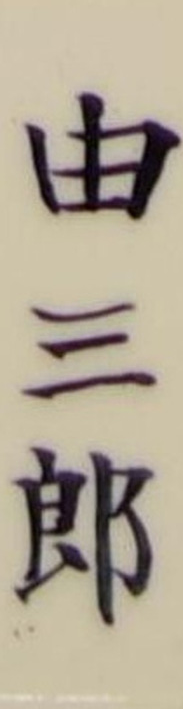由三郎
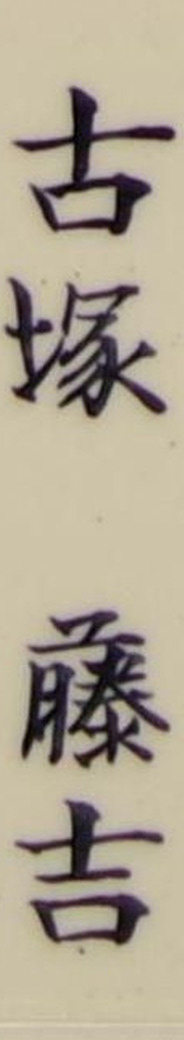古塚藤吉
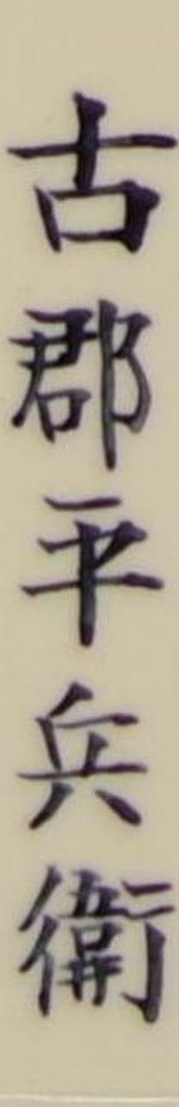古郡平兵衛
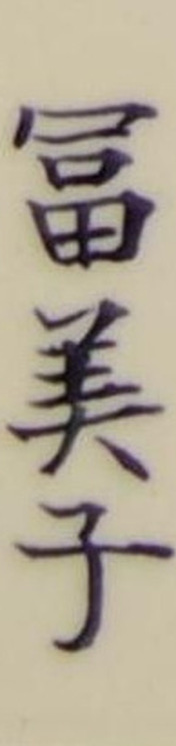冨美子
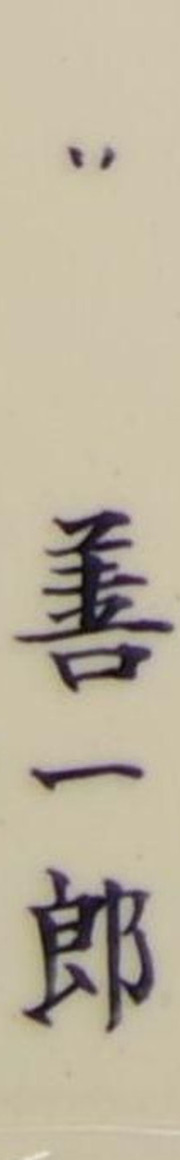善一郎
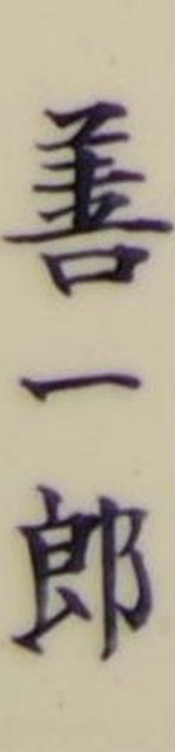善一郎
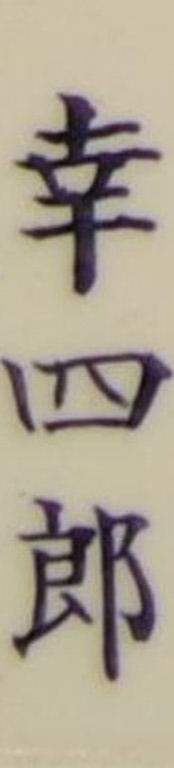幸四郎
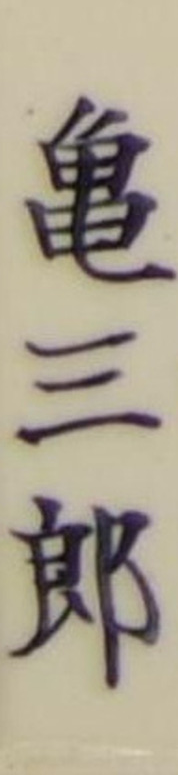亀三郎

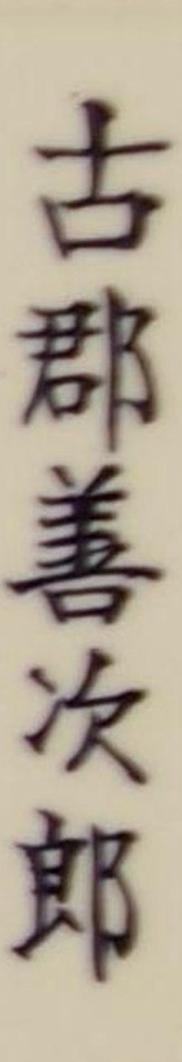古郡善次郎
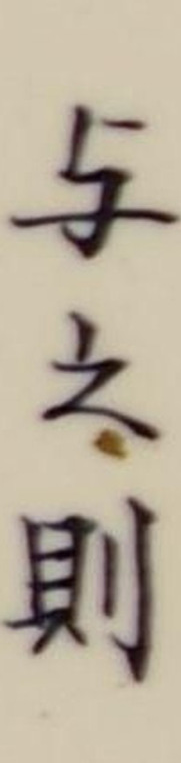与之則
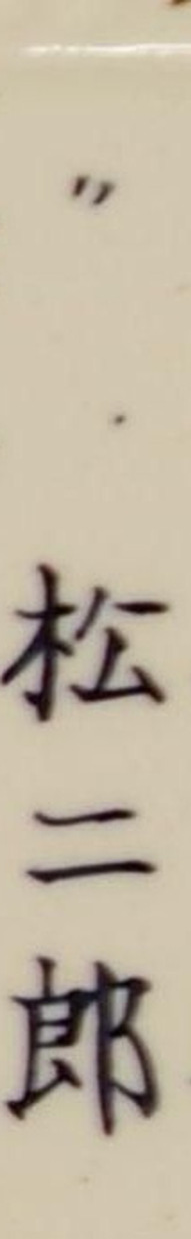松二郎
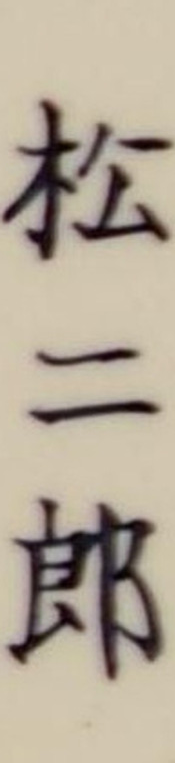松二郎
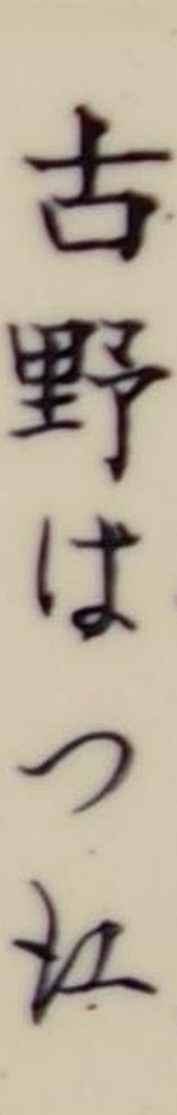古野はつ江
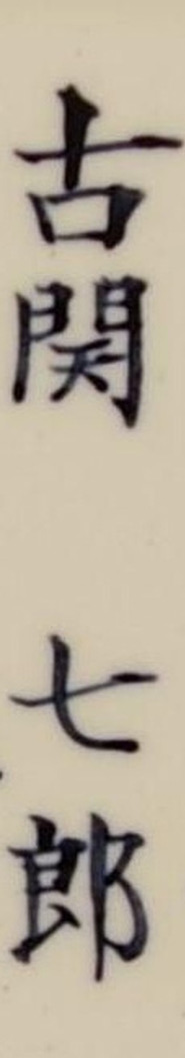古開七郎
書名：E~L
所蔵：高野山金剛峯寺
